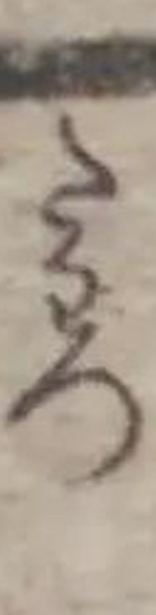たわつ
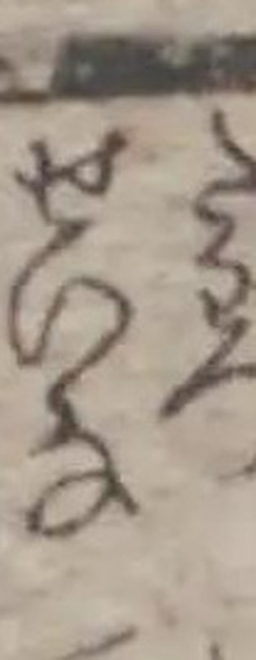せいな
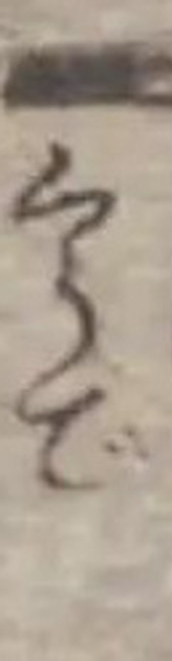くらで
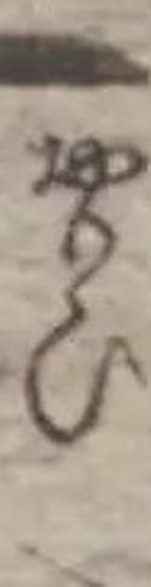おもひ
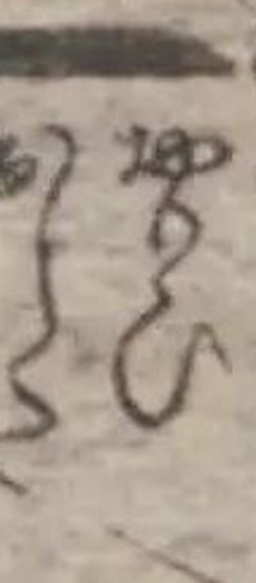出した
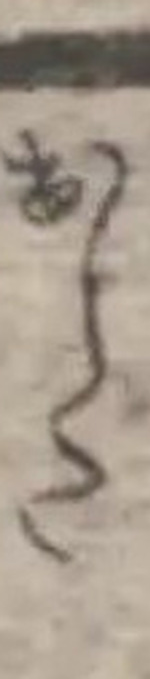出した
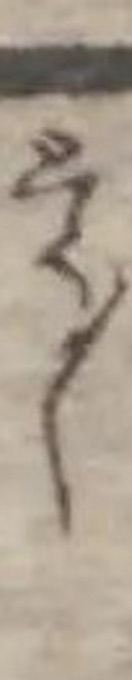とう〳〵
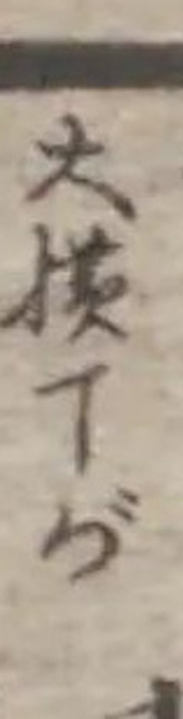大横丁が
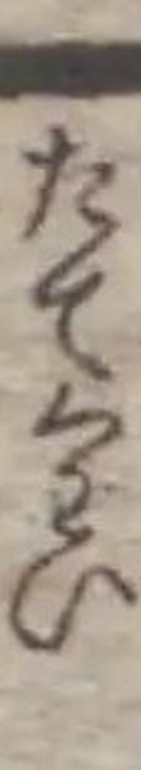たてくわひ
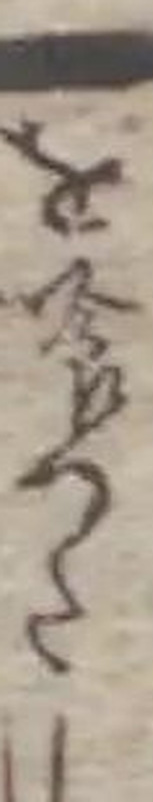を倉つた
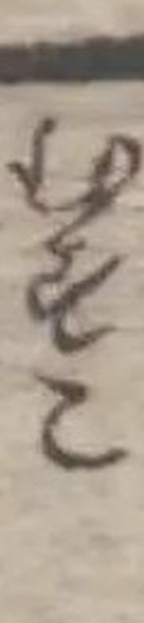むすこ
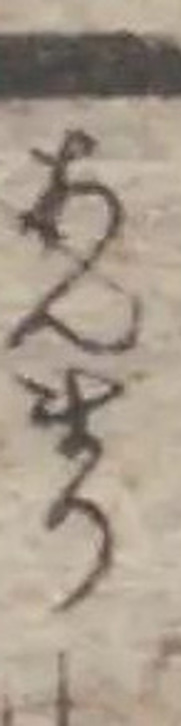あんまり
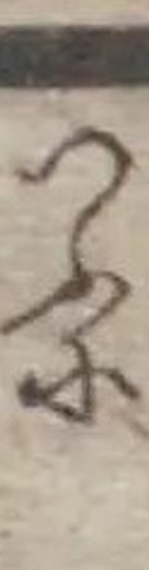つふに
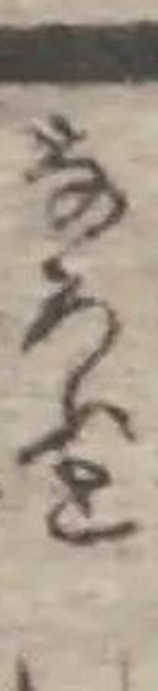なろふと
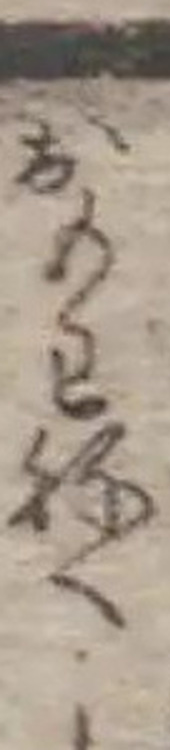おもわねへ
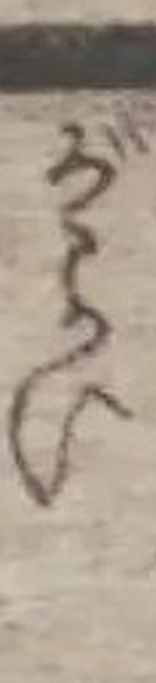がよい
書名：早出来 3巻
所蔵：国立国会図書館 National Diet Library, JAPAN
